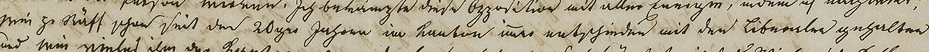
wie Hr. Näff schon seit den 20ger Jahren im Kanton immer entschieden mit den Liberalen gehalten
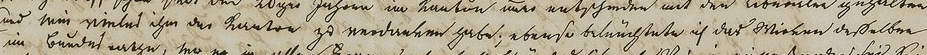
(und wie vieles ihm der Kanton zu verdanken habe); ebenso beleuchtete ich das Wirken deßelben
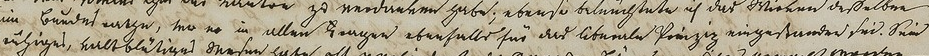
im Bundesrathe, wo er in allen Fragen ebenfalls für das liberale Prinzip eingestanden sei. Sein
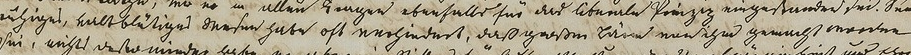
ruhiges, kaltblütiges Wesen habe oft verhindert, daß großer Lärm von ihm gemacht worden
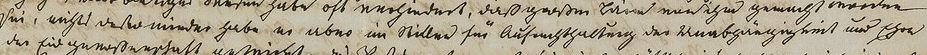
sei, nichts desto minder habe er aber im Stillen für Aufrechthaltung der Unabhängigkeit und Ehre
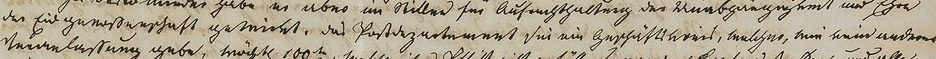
der Eidgenoßenschaft gewirkt. Das Postdepartement sei ein Geschäftskreis, welcher, wie kein anderer
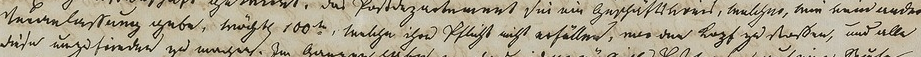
Veranlaßung gebe, wöchentlich 100te, welche ihre Pflicht nicht erfüllen, vor den Kopf zu stoßen, und alle
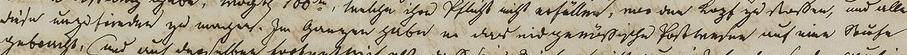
diese unzufrieden zu machen. Im Ganzen habe er aber das eidgenößische Postwesen auf eine Stufe
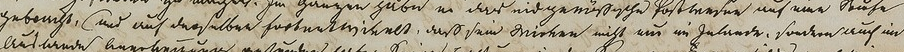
gebracht, (und auf derselben fortentwikelt), daß sein Wirken nicht nur im Inlande, sondern auch im
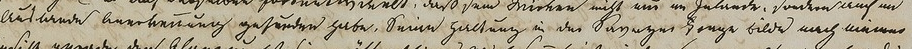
Auslande Anerkennung gefunden habe. Seine Haltung in der Savoyer Frage bilde nach meiner
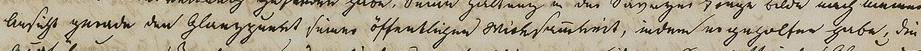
Ansicht gerade den Glanzpunkt seiner öffentlichen Wirksammkeit, indem er geholfen habe, die
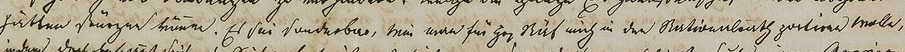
hätten stürzen können. Es sei sonderbar, wie man für Hr. Näf mich in den Nationalrath portieren wolle,
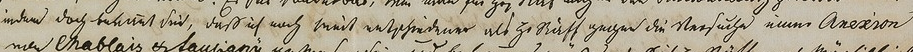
indem doch bekannt sei, daß ich noch weit entschiedener als Hr. Näff gegen die Versuche einer Anexion
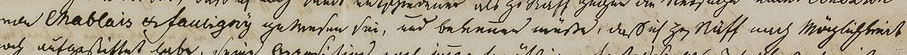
von Chablais & Faucigny gewesen sei, und bekennen müße, daß ich Hr. Näff nach Möglichkeit
